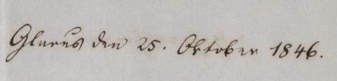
Glarus den 25. Oktober 1846.
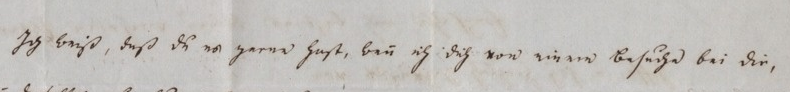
Ich weiß, daß du es gerne hast, wenn ich dich von einem Besuche bei dir,
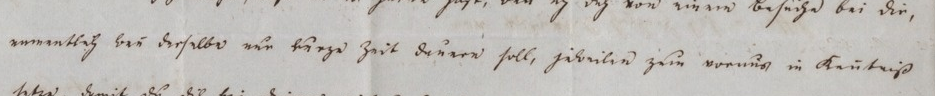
namentlich wenn derselbe nur kurze Zeit dauern soll, jeweilen zum voraus in Kenntniß
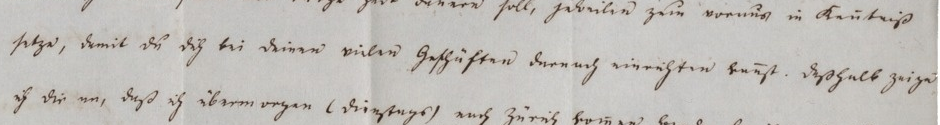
setze, damit du dich bei deinen vielen Geschäften darnach einrichten kannst. Deßhalb zeige
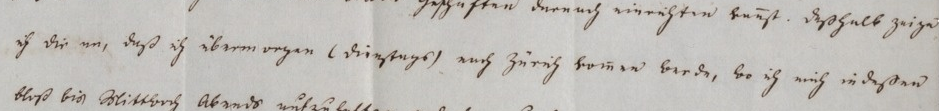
ich dir an, daß ich übermorgen (Dienstags) nach Zürich kommen werde, wo ich mich indessen
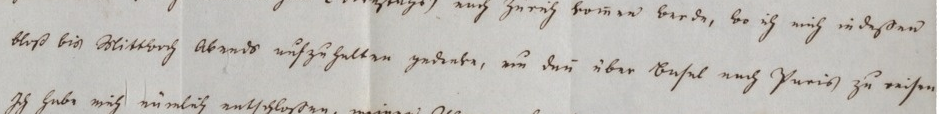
bloß bis Mittwoch Abends aufzuhalten gedenke, um dann über Basel nach Paris zu reisen.
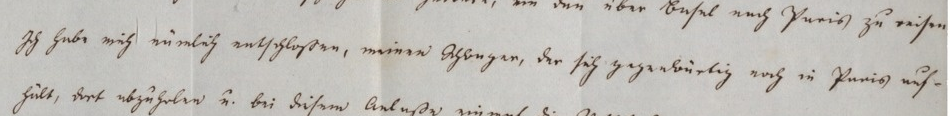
Ich habe mich nämlich entschlossen, meinen Schwager, der sich gegenwärtig noch in Paris auf-
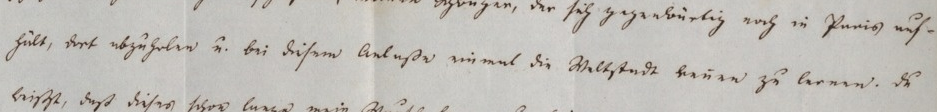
hält, dort abzuholen u. bei diesem Anlaße einmal die Weltstadt kennen zu lernen. Du
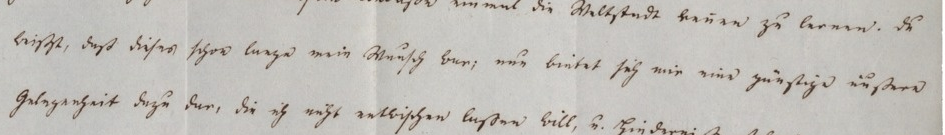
weißst, daß dieses schon lange mein Wunsch war; nun bietet sich mir eine günstige äußere
